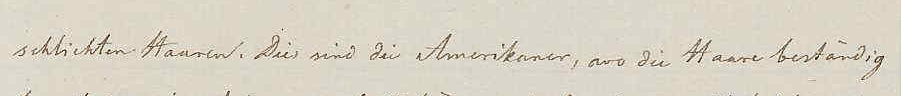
schlichten Haaren. Dies sind die Amerikaner, wo die Haare beständig
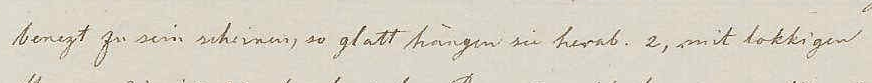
benezt zu sein scheinen, so glatt hängen sie herab. 2, mit lokkigen
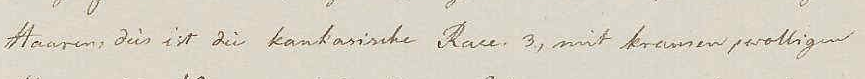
Haaren, dies ist die kaukasische Race. 3, mit krausen, wolligen
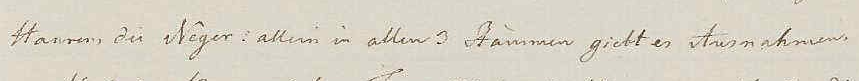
Haaren, die Neger: allein in allen 3 Stämmen giebt es Ausnahmen.
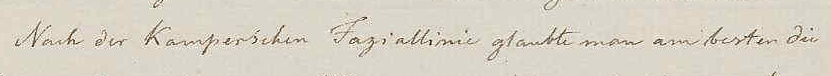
Nach der Kamperschen Faziallinie glaubte man am besten die
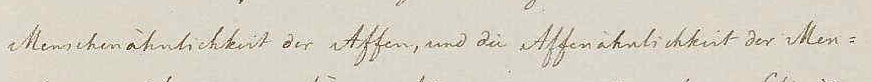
Menschenähnlichkeit der Affen, und die Affenähnlichkeit der Men-
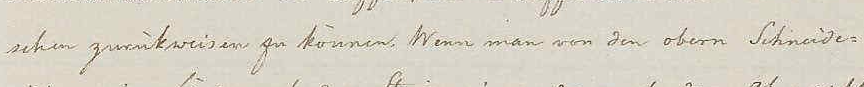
schen zurükweisen zu können. Wenn man von den obern Schneide-
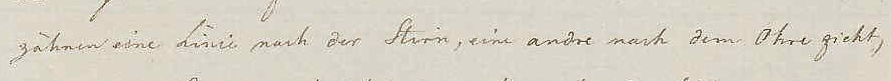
zähnen eine Linie nach der Stirn, eine andre nach dem Ohre zieht,
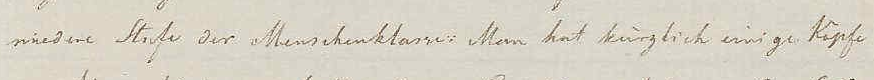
nuiedere Stufe der Menschenklasse. Man hat kürzlich einige Köpfe
